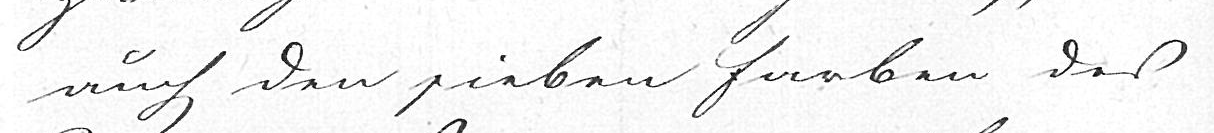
auch den sieben Farben des
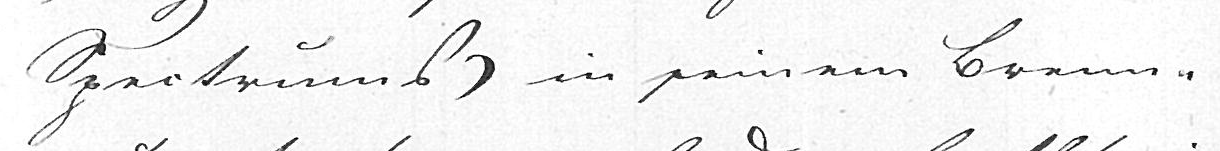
Spectrums) in seinem Brenn-
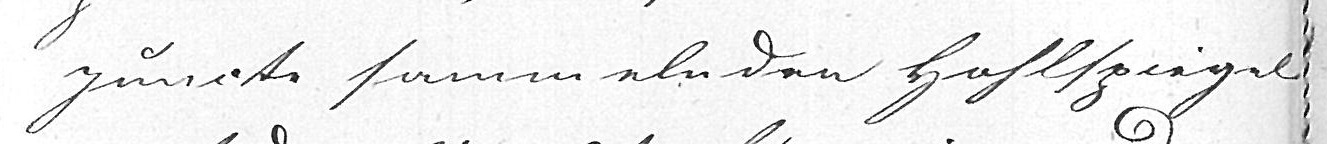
puncte sammelenden Hohlspiegel
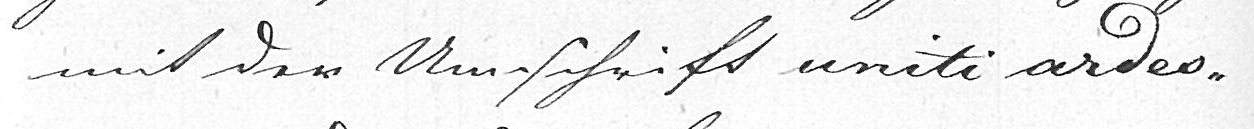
mit der Umschrift uniti ardeo-
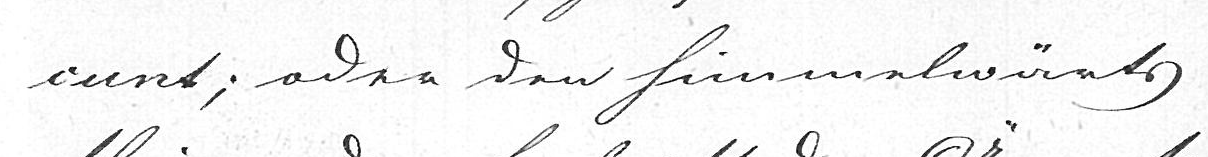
cunt; oder den himmelwärts
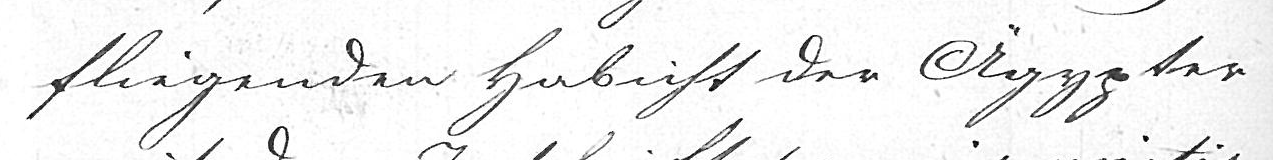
fliegenden Habicht der Ägypter
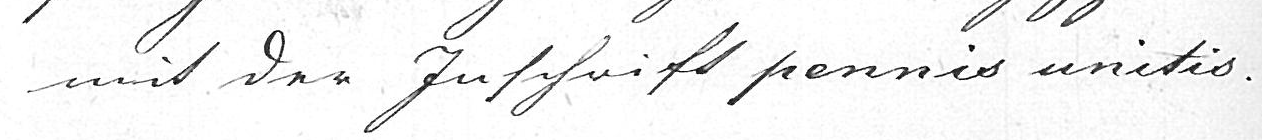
mit der Inschrift pennis unitis.
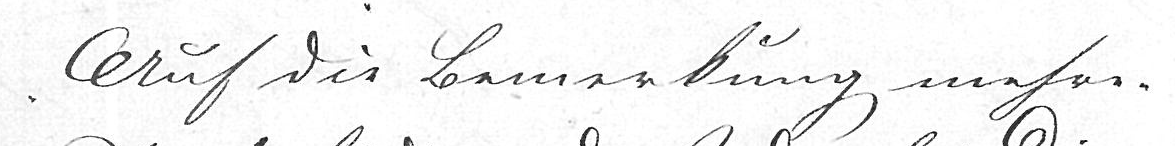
Auf die Bemerkung mehre-
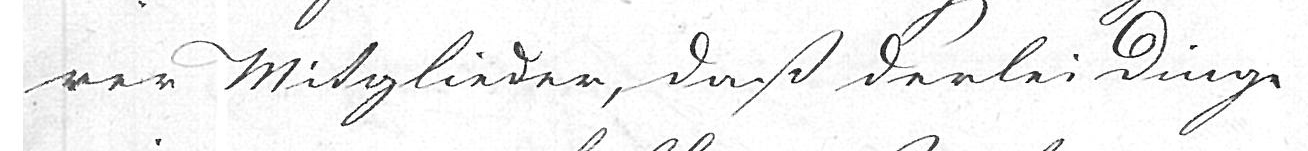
rer Mitglieder, daß derlei Dinge
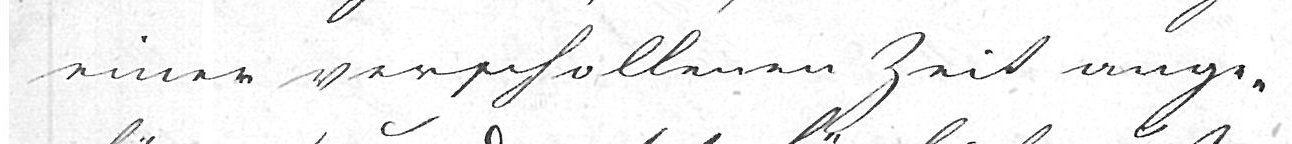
einer verschollenen Zeit ange-
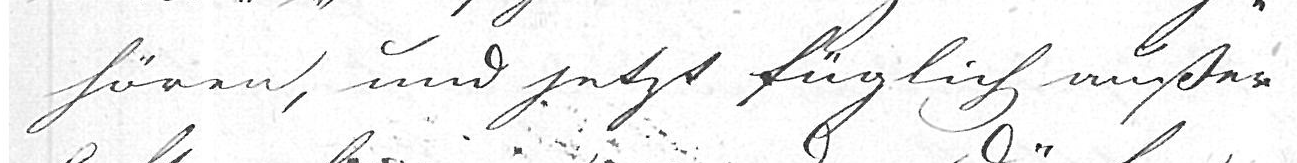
hören, und jetzt füglich außer
